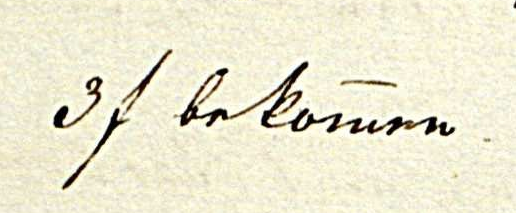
3f bekommen.
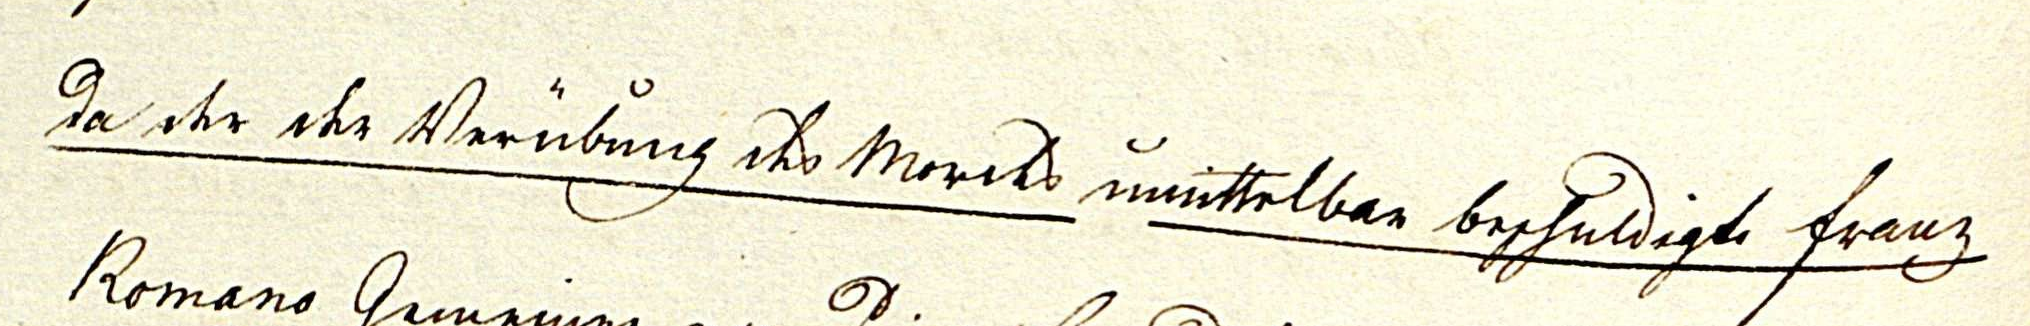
Da der der Verübung des Mordes unmittelbar beschuldigte Franz
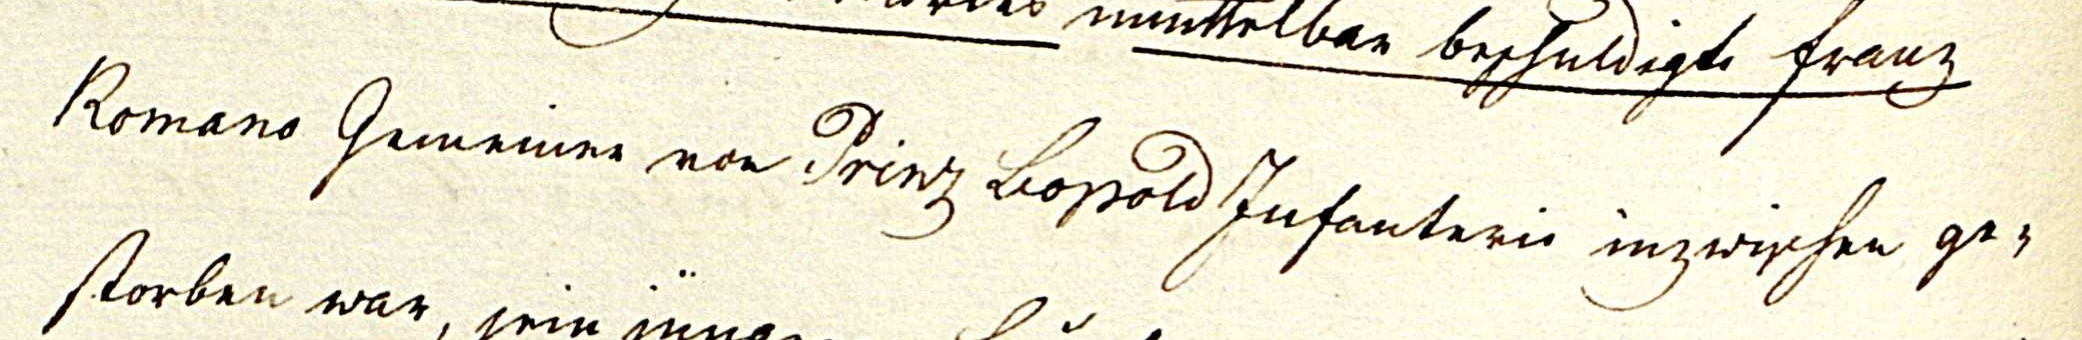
Romano Gemeiner von Prinz Leopold Infanterie inzwischen ge¬
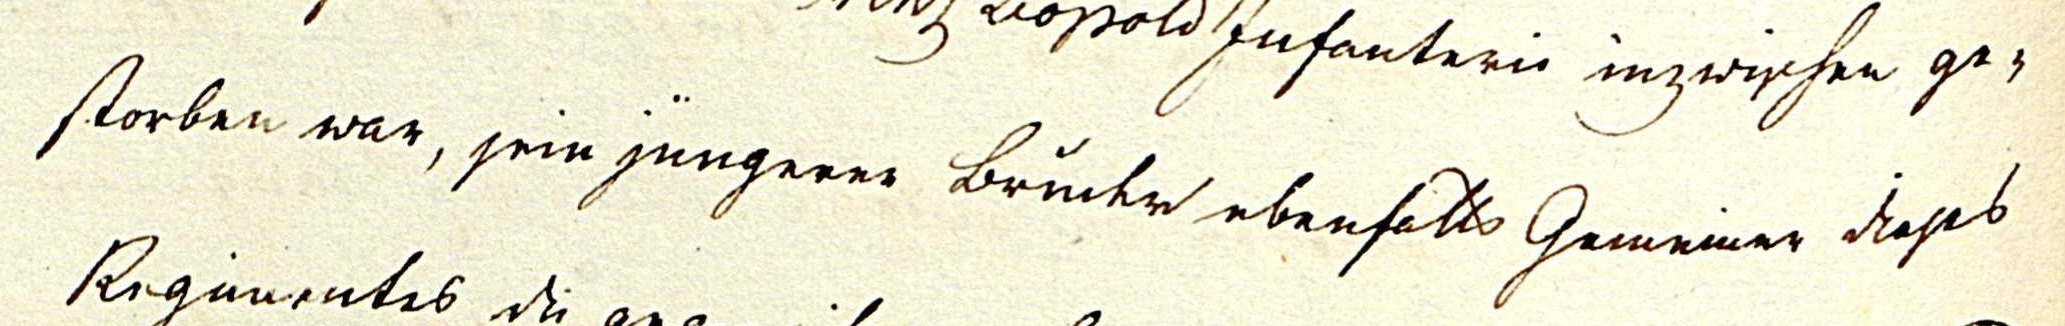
storben war, sein jüngerer Bruder ebenfalls Gemeiner dieses
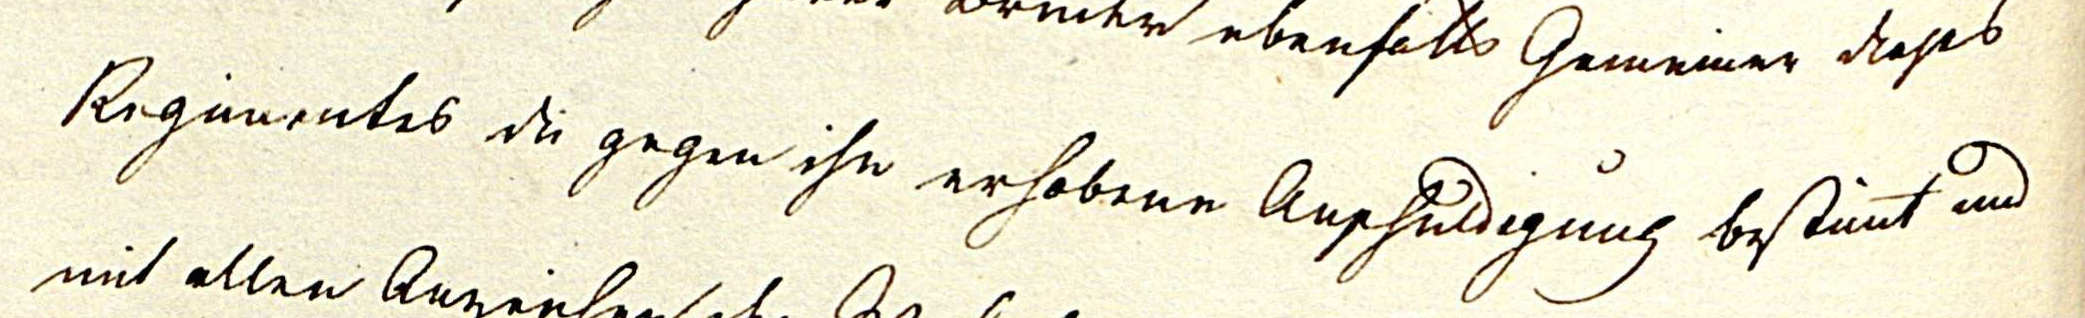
Regimentes die gegen ihn erhobene Anschuldigung bestimmt und
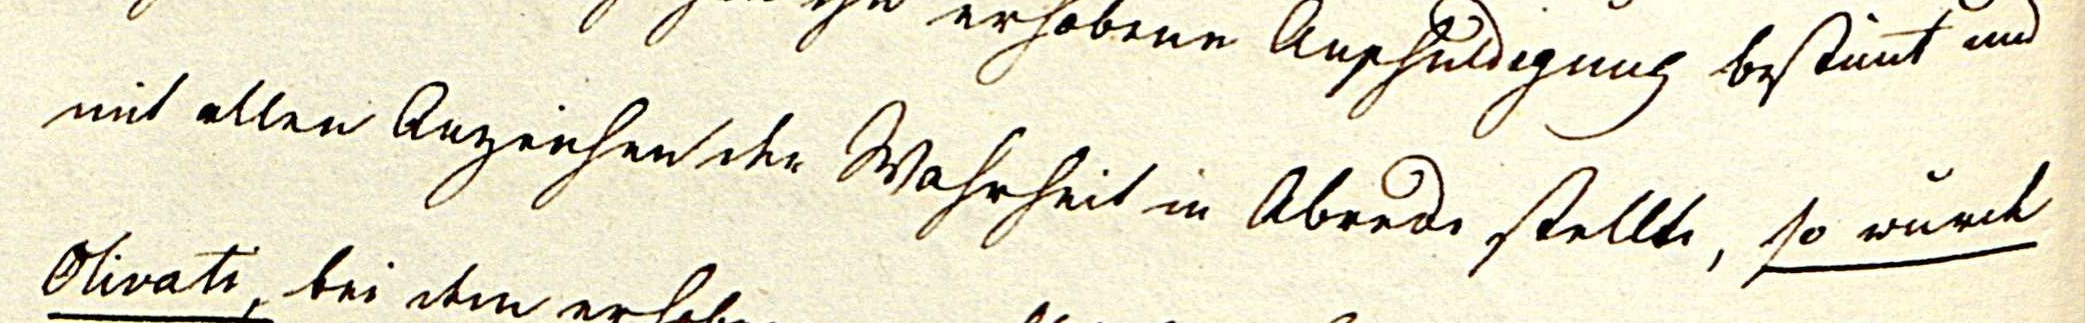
mit allen Anziehen der Wahrheit in Abrede stellte, so wurde
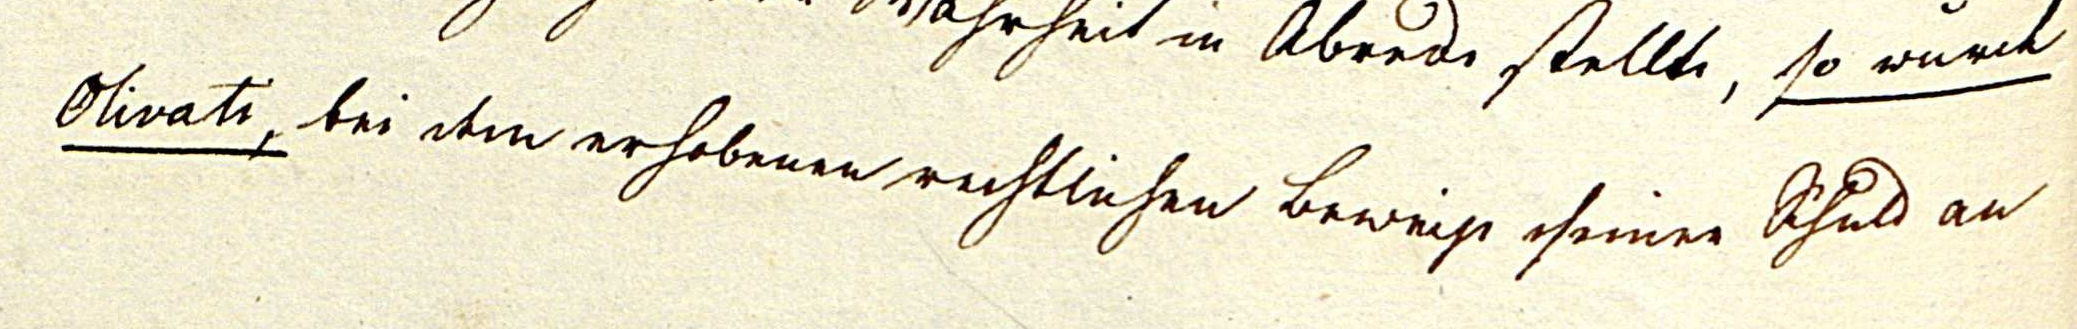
Olivatti, bei den erhobenen rechtlichen Beweis seiner Schuld an
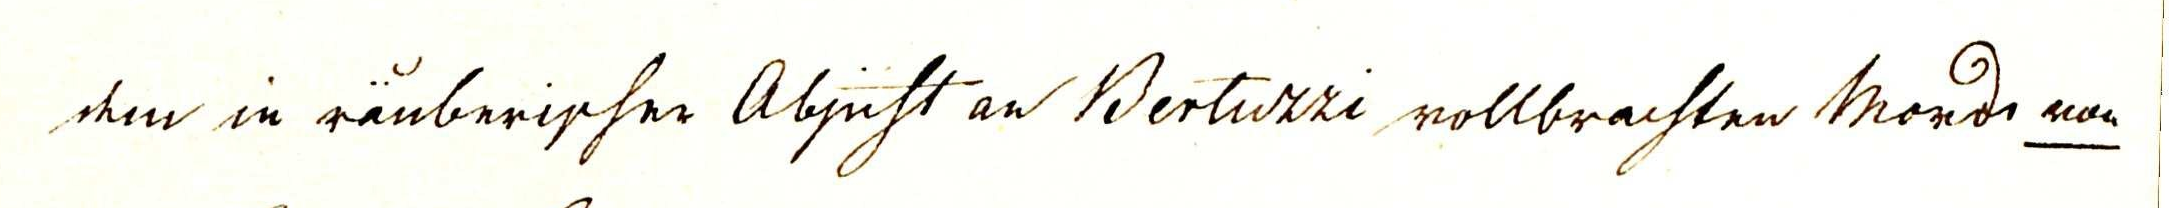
den in räuberischer Absicht an Bertuzzi vollbrachten Morde von
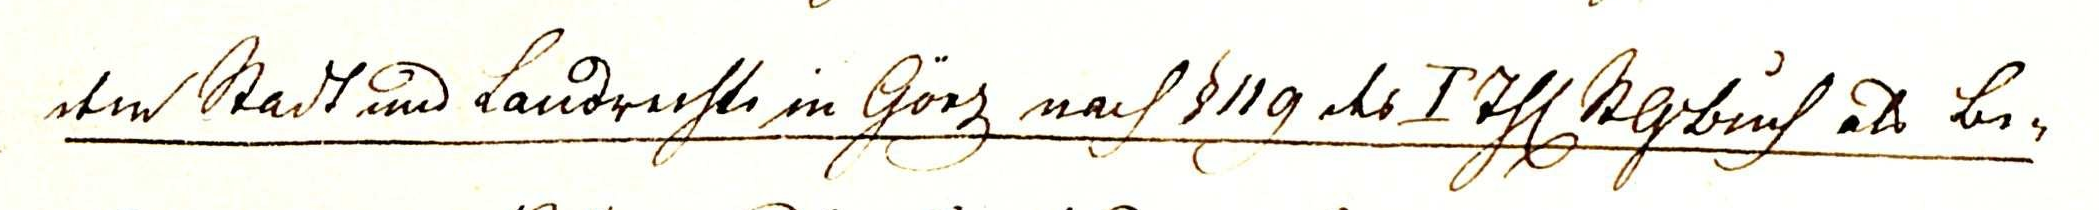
dem Stadt und Landrechte in Görz nach §119 des I. ThE StGBuch als Be¬
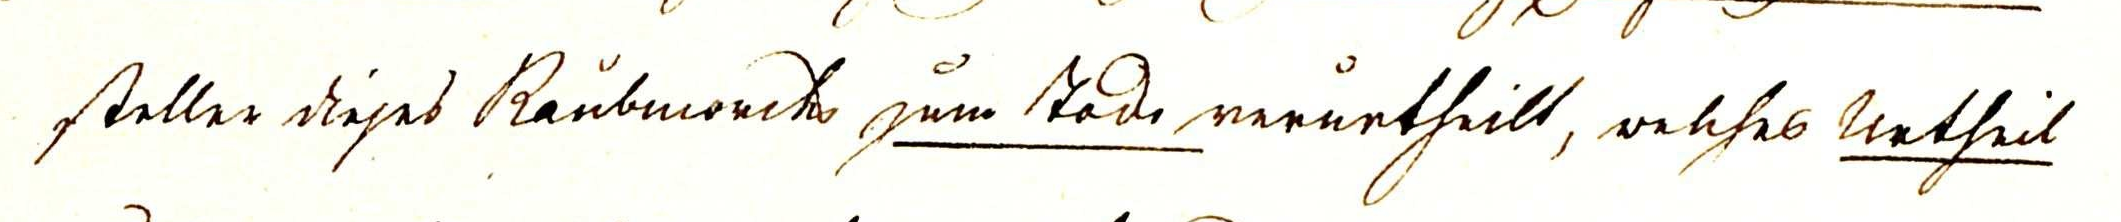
steller dieses Raubmordes zum Tode verurtheilt, welches Urtheil
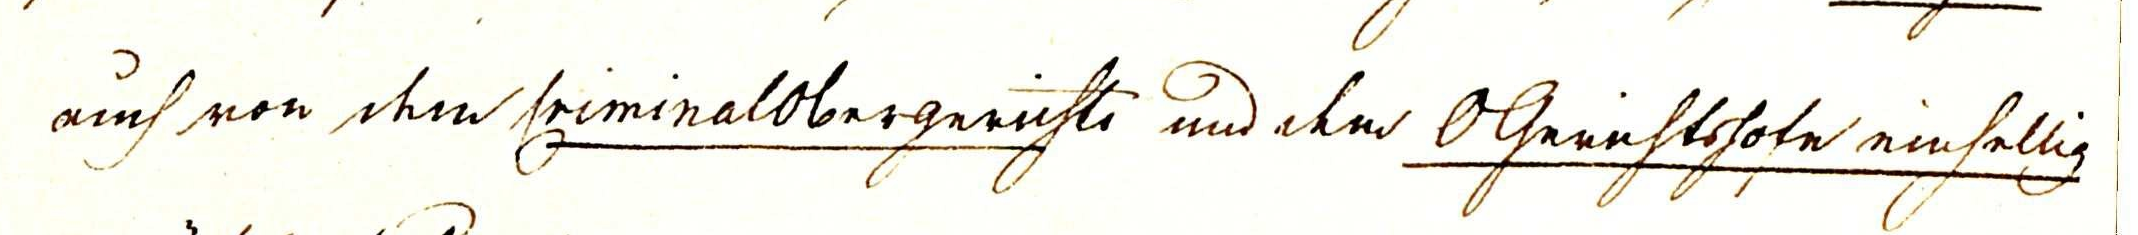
auch von dem CriminalObergerichte und dem OGerichtshofe einhellig
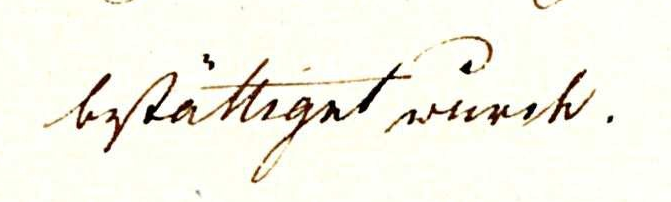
bestätiget wurde.
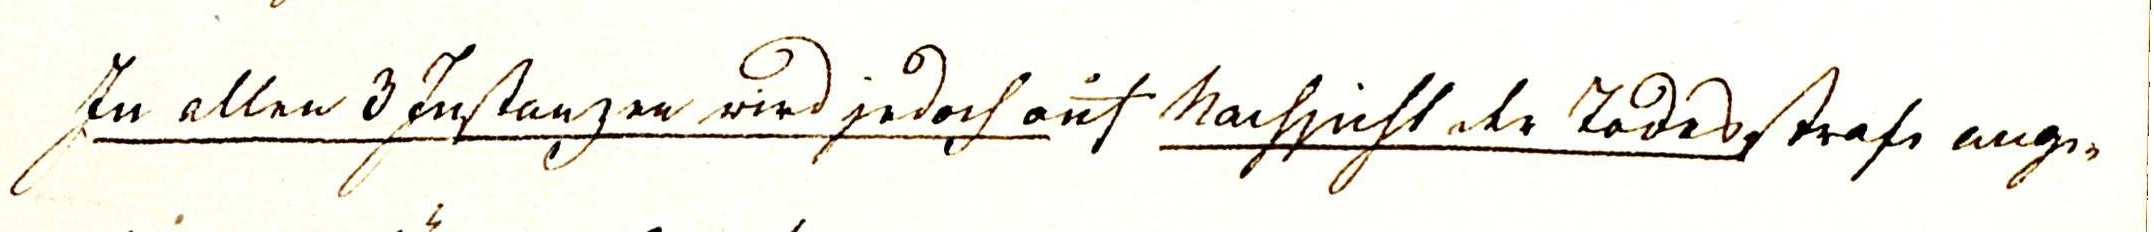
In allen 3 Instanzen wird jedoch auf Nachsicht der Todesstrafe ange¬
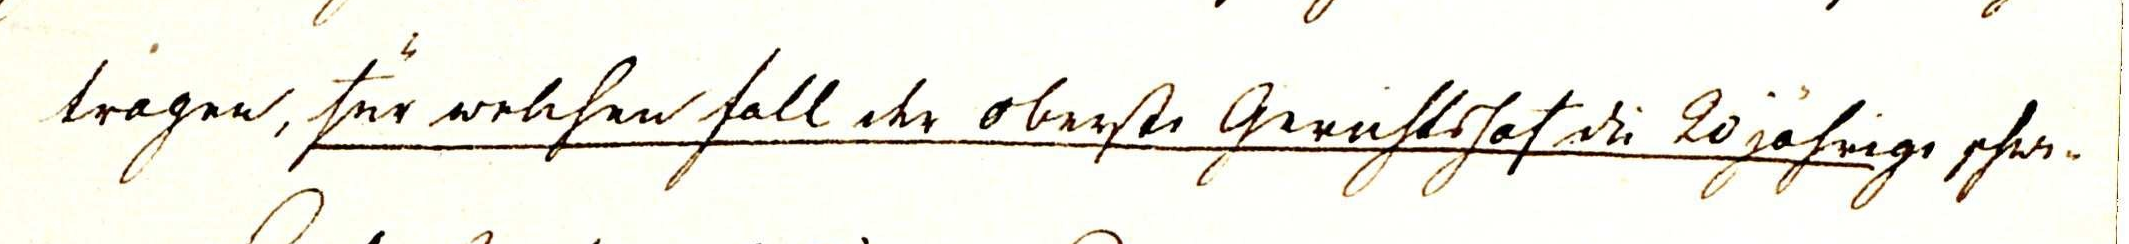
tragen, für welchen Fall der oberste Gerichtshof die 20jährige schwa¬
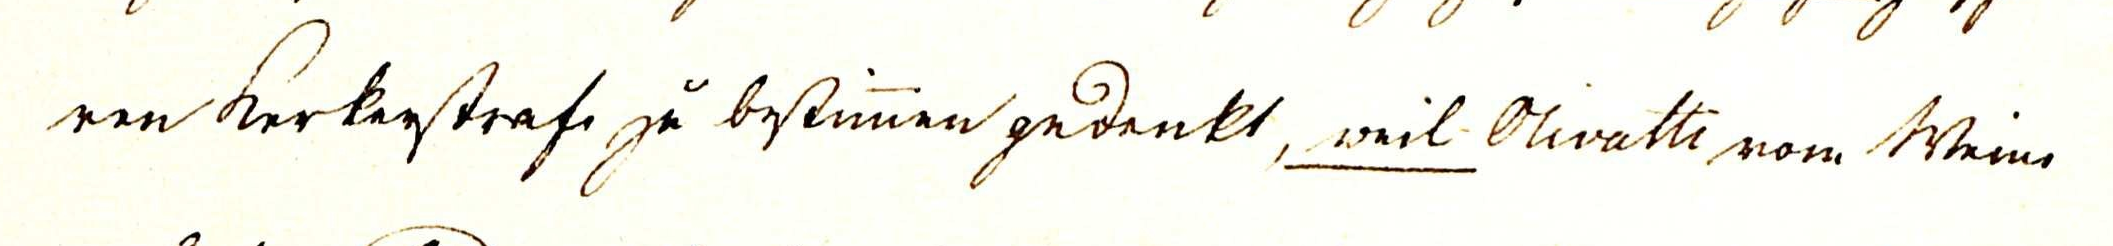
ren Kerkerstrafe zu bestimmen gedenkt, weil Olivatti vom Weine
